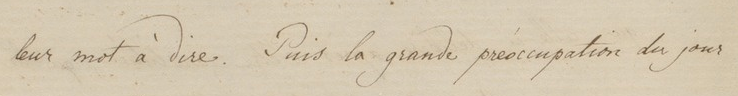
leur mot à dire. Puis la grande préoccupation du jour
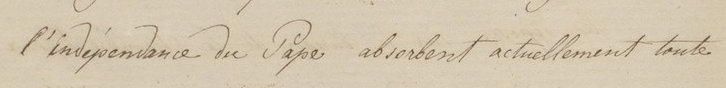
l'indépendance du Pape absorbent actuellement toute
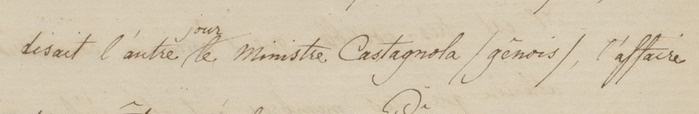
disait l'autre jour le Ministre Castagnola(gênois), l'affaire
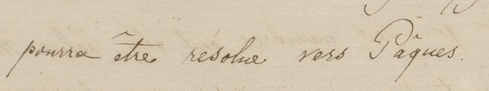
pourra être resolue vers Pâques.
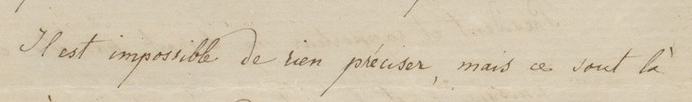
Il est impossible de rien préciser, mais ce sont là
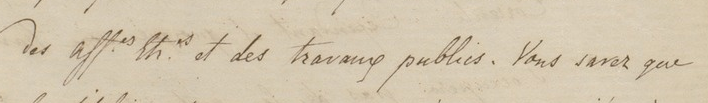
des Affes Etres et des travaux publics. Vous savez que
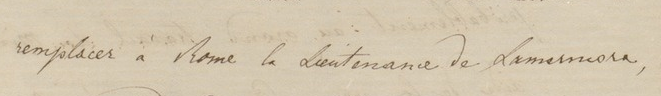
remplacer à Rome la Lieutenance de Lamarmora,
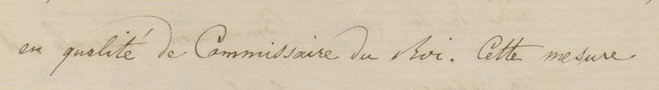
en qualité de Commissaire du Roi. Cette mesure
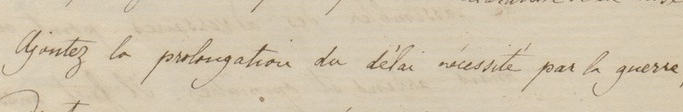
Ajoutez la prolongation du délai nécessité par la guerre,
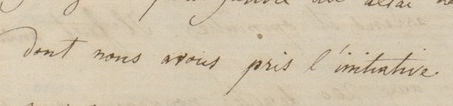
dont nous avons pris l'initiative.
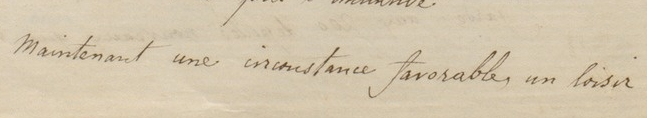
Maintenant une circonstance favorable un loisir
